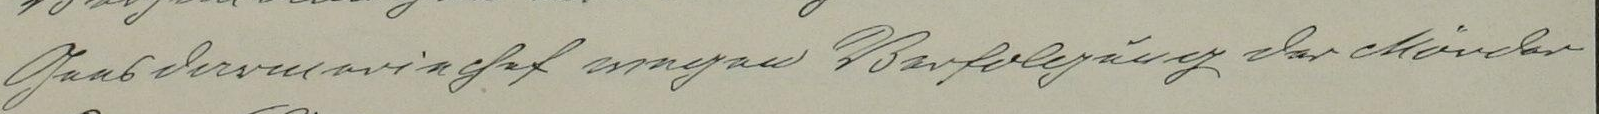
Gensdarmeriechef wegen Verfolgung der Mörder
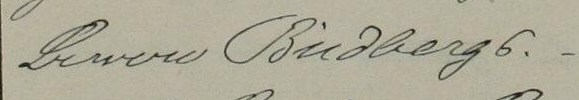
Baron Budbergs.
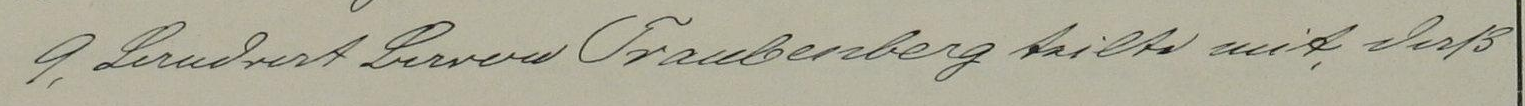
9. Landrat Baron Traubenberg teilte mit, daß
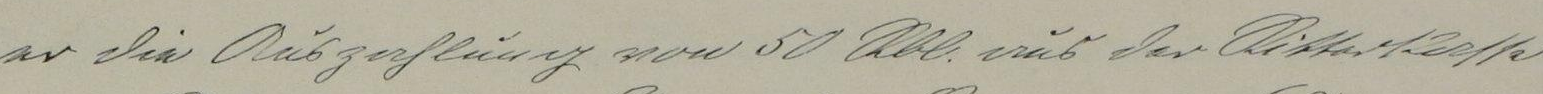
er die Auszahlung von 50 Rbl. aus der Ritterkasse
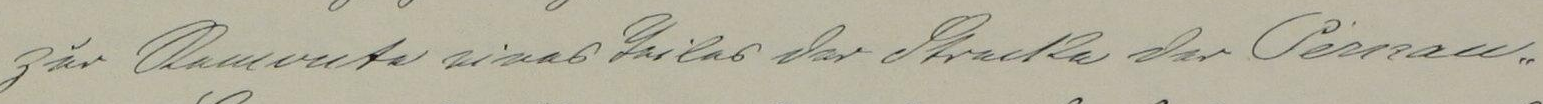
zur Remonte eines Teiles der Strecke der Pernau-
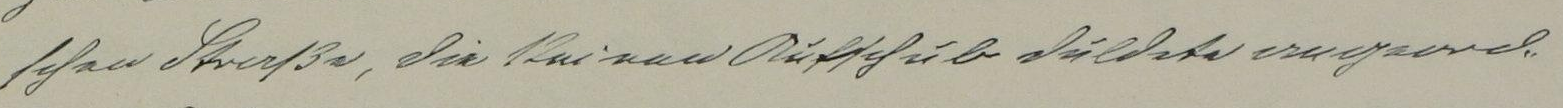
schen Straße, die keinen Aufschub duldete angeord-
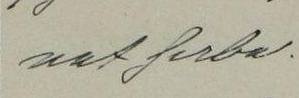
net habe.
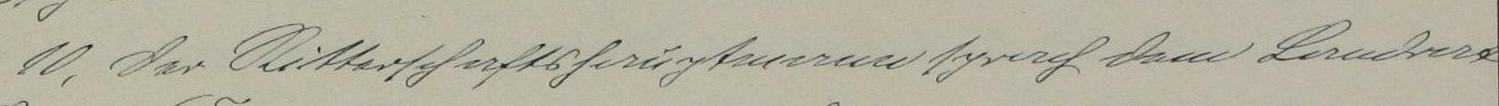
10. Der Ritterschaftshauptmann sprach dem Landrat
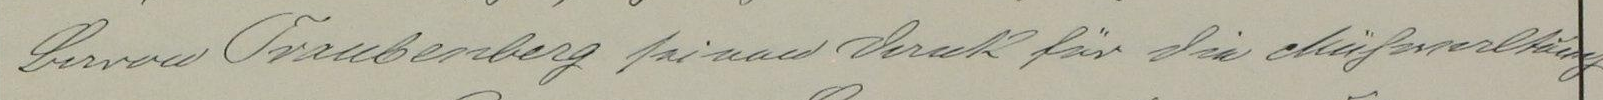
Baron Traubenberg seinen Dank für die Mühwaltung
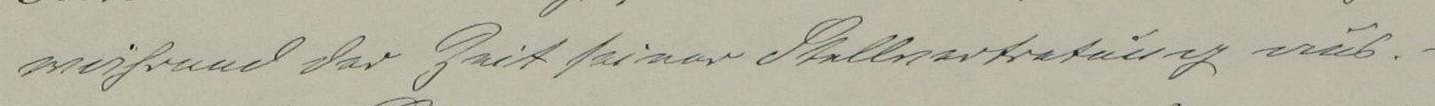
während der Zeit seiner Stellvertretung aus.
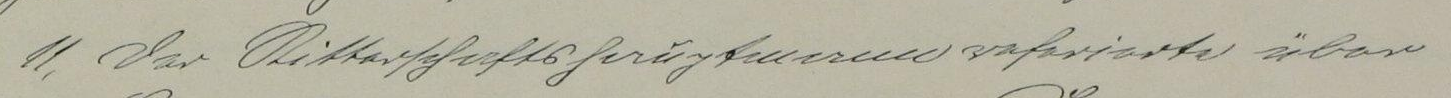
11. Der Ritterschaftshauptmann referierte über
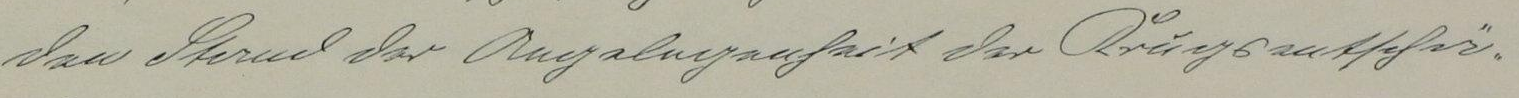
den Stand der Angelegenheit der Krugsentschä-
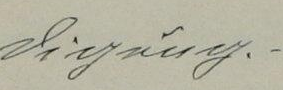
digung.
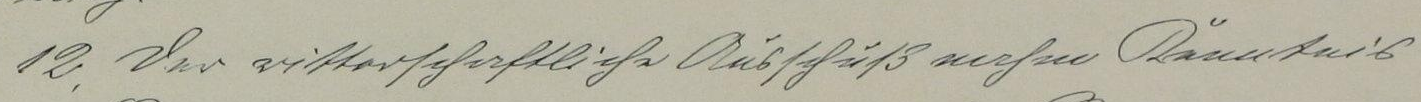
12. Der ritterschaftliche Ausschuß nahm Kenntnis
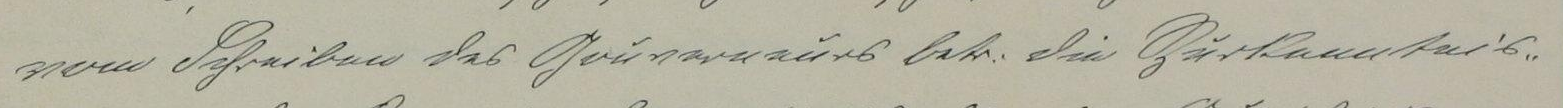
vom Schreiben des Gouverneurs betr. die Zurkenntnis-
